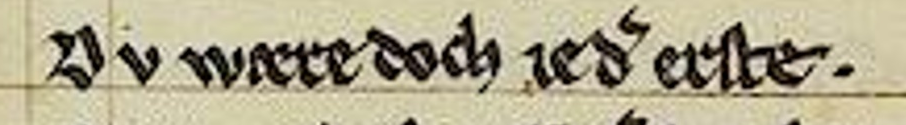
Dv w[ae]re doch ied(er) erſte.
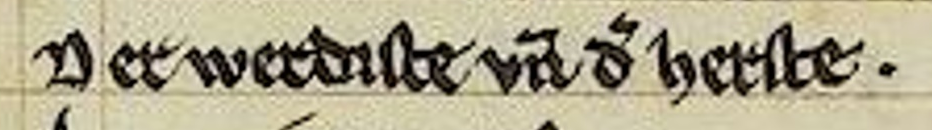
Der werdiſte vn(d) d(er) herſte.
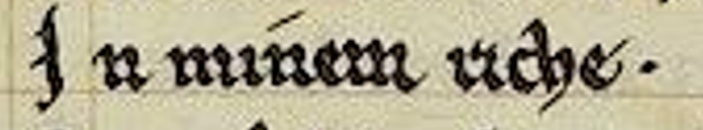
In minem riche.
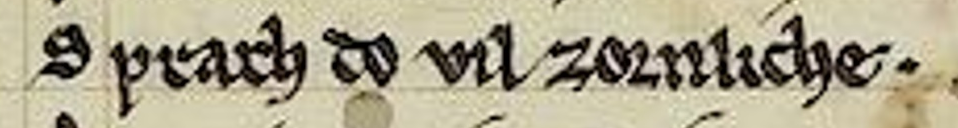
Sprach do vil zornliche.
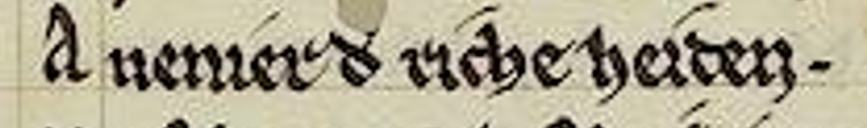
Auenier d(er) riche heiden.
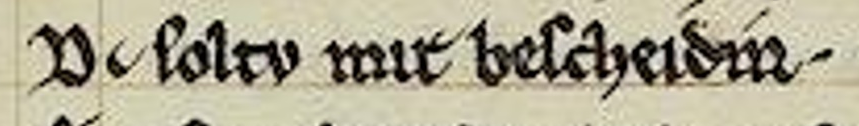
D(az) ſoltv mir beſcheidin.
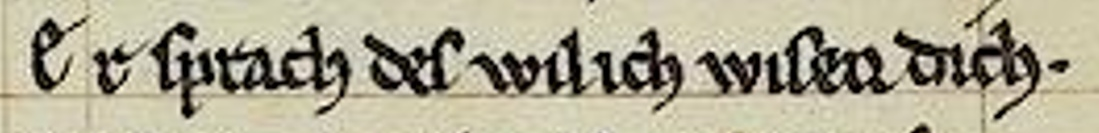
Er ſprach deſ wil ich wiſen dich.
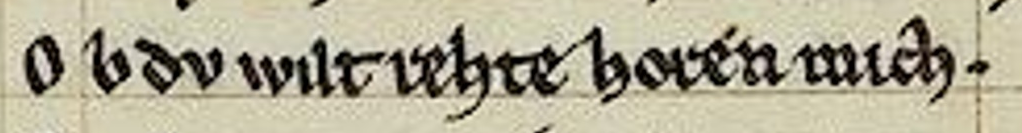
Ob dv wilt rehte horen mich.
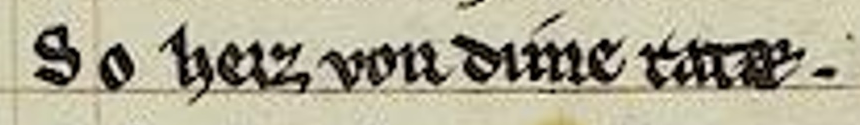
So heiz von dime rat[ae].
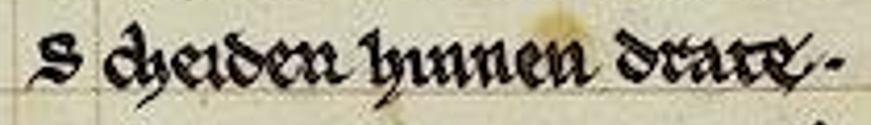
Scheiden hinnen drate.
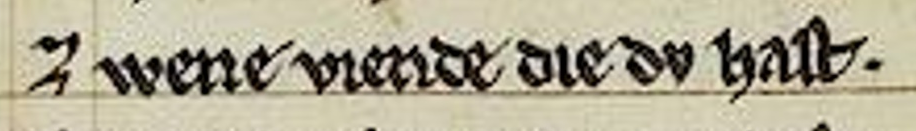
Zwene viende die dv haſt.
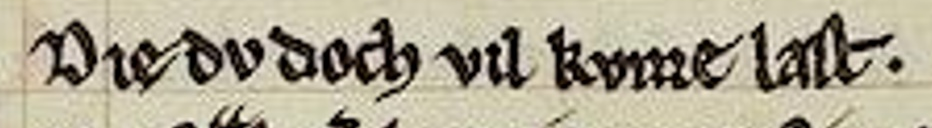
Die dv doch vil kvme laſt.
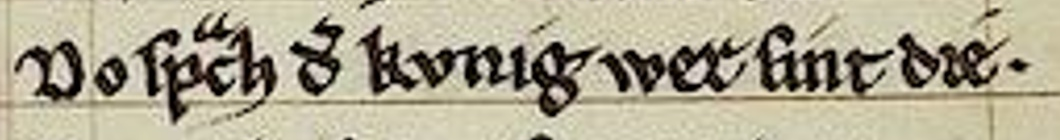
Do ſp(ra)ch d(er) kvnig wer ſint die.
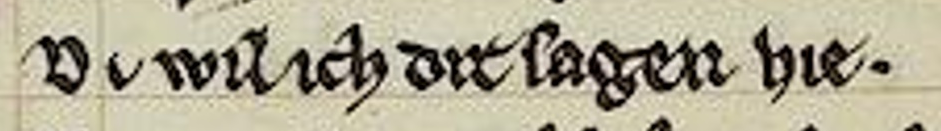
D(az) wil ich dir ſagen hie.
